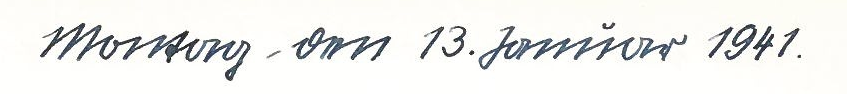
Montag, den 13. Januar 1941.
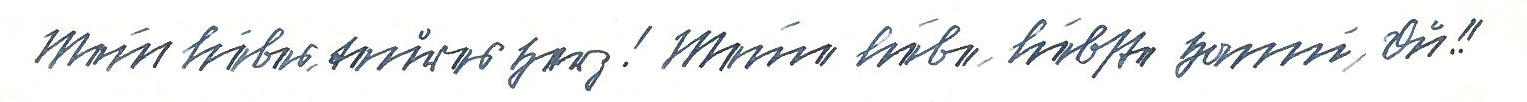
Mein liebes, teures Herz! Meine liebe, liebste, Du!!
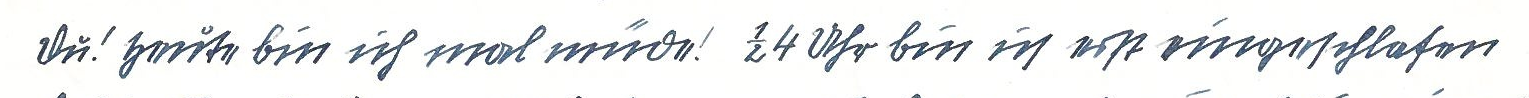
Du! Heute bin ich mal müde! ½ 4 Uhr bin ich erst eingeschlafen
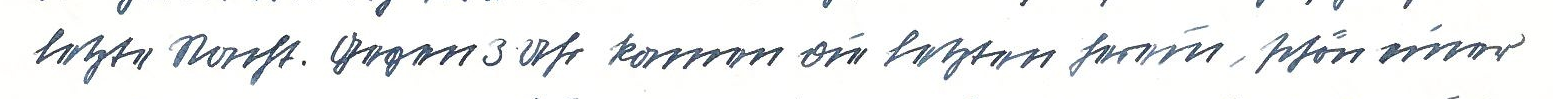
letzte Nacht. Gegen 3 Uhr kamen die letzten herein, schön einer
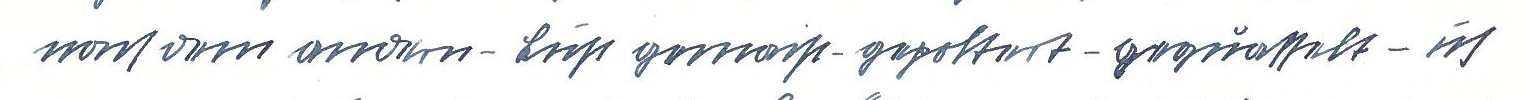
nach dem andern – Licht gemacht – gepoltert – gequasselt – ich
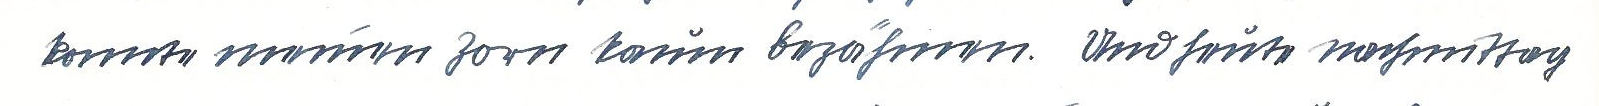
konnte meinen Zorn kaum bezähmen. Und heute nachmittag
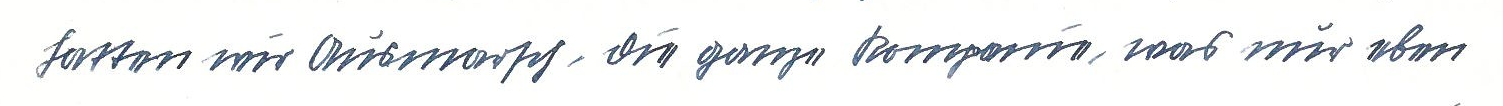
hatten wir Ausmarsch, die ganze Kompanie, was nur eben
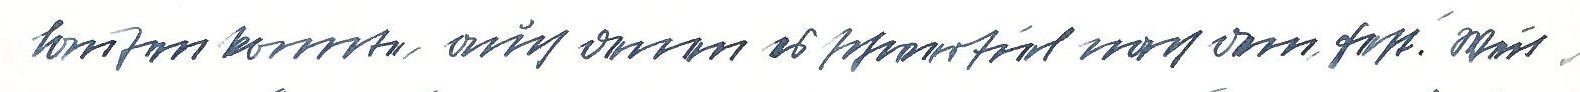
laufen konnte, auch denen es schwerfiel nach dem Fest. Weil
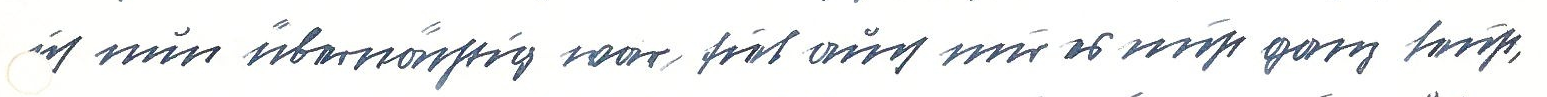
ich nun übernächtig war, fiel auch mir es nicht ganz leicht,
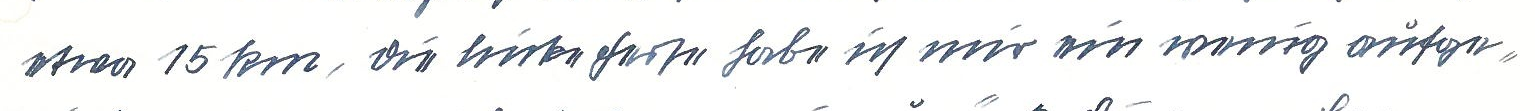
etwa 15 km, die linke Ferse habe ich mir ein wenig aufge¬
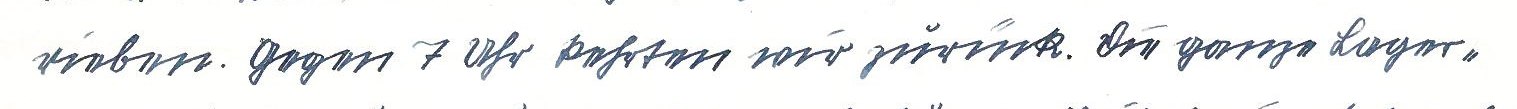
rieben. Gegen 7 Uhr kehrten wir zurück. Die ganze Lager¬
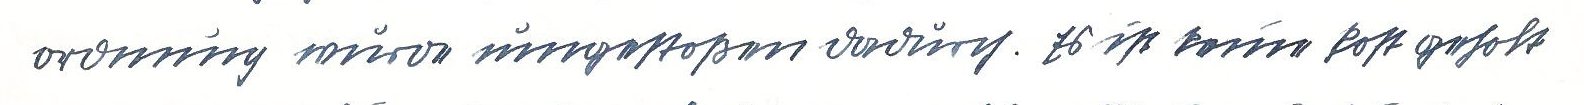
ordnung wurde umgestoßen dadurch. Es ist keine Post geholt
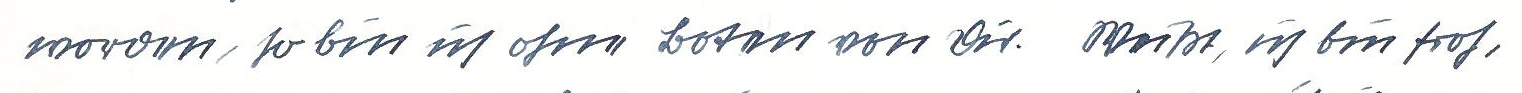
worden, so bin ich ohne Boten von Dir. Weißt, ich bin froh,
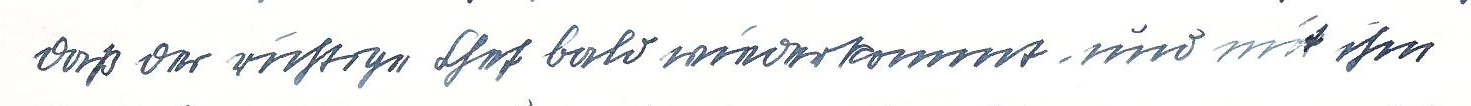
daß der richtige Chef bald wiederkommt, und mit ihm
